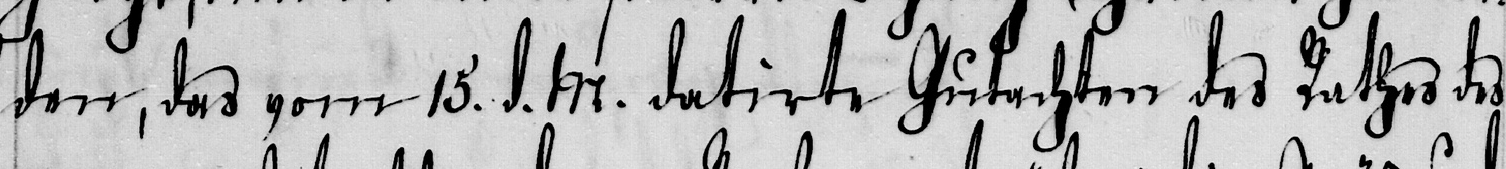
den, das vom 15. d. M. datirte Gutachten des Rathes des
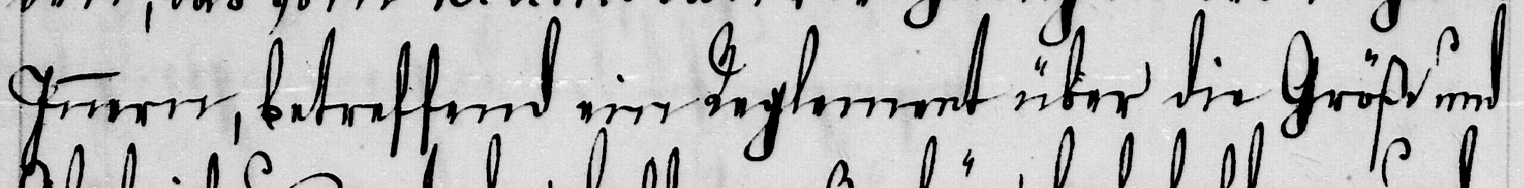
Innern, betreffend ein Reglement über die Größe und
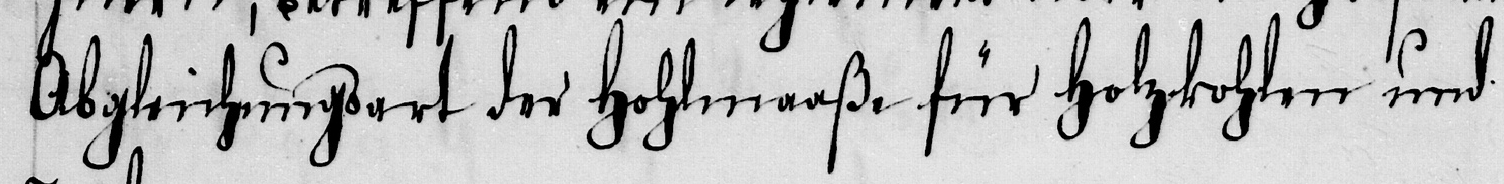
Abgleichungsart der Hohlmaaße für Holzkohlen und
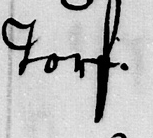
Torf.
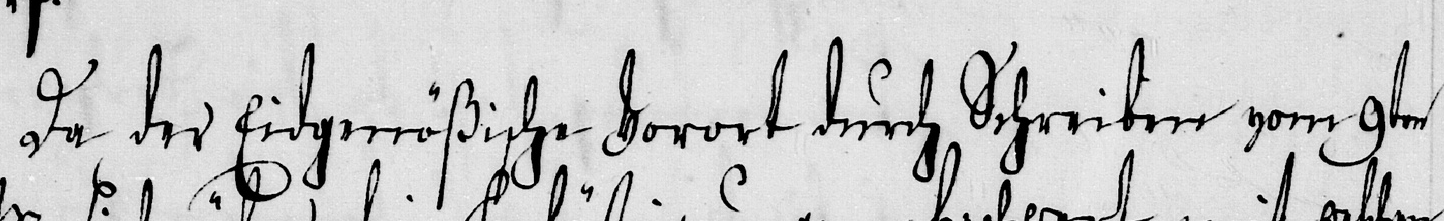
Da der Eidgenößische Vorort durch Schreiben vom 9ten
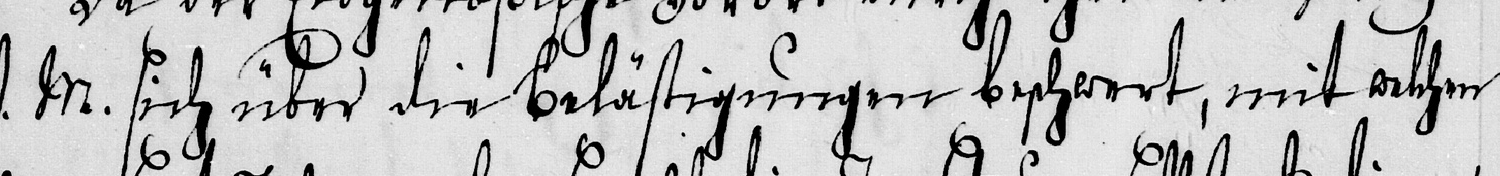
M. sich über die Belästigungen beschwert, mit welchen
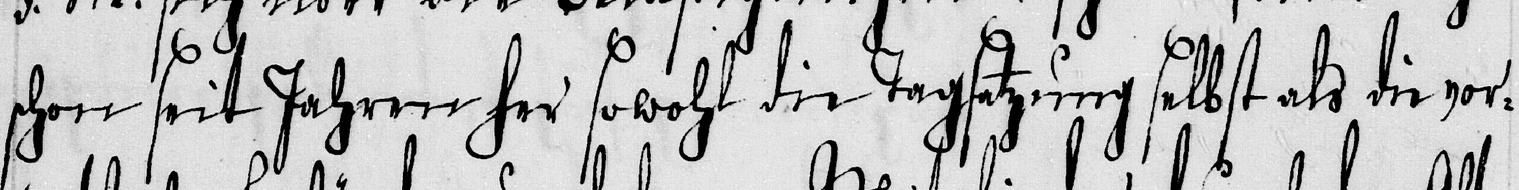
schon seit Jahren her sowohl die Tagsatzung selbst als die vor¬
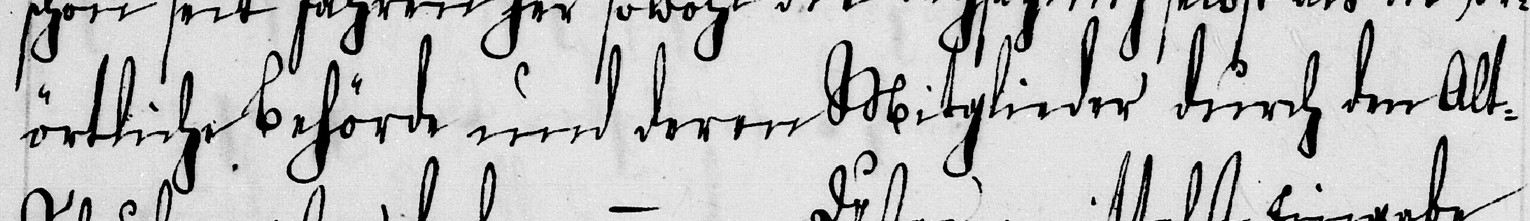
örtliche Behörde und deren Mitglieder durch den Al¬
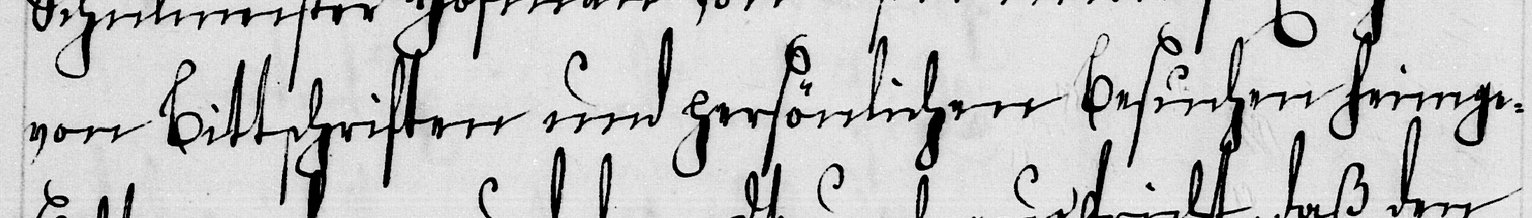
von Bittschriften und persönlichen Besuchen heimge¬
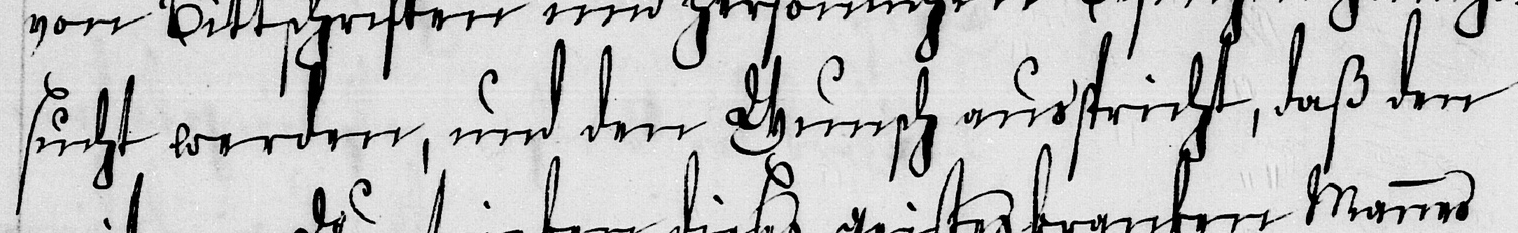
sucht werden, und den Wunsch ausspricht, daß den
